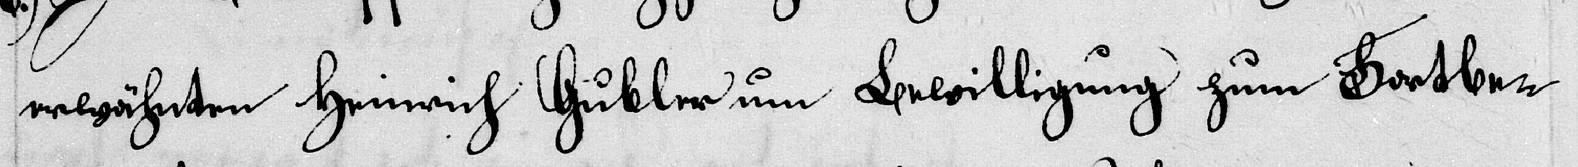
erwähnten Heinrich Gubler um Bewilligung zum Fortbe¬
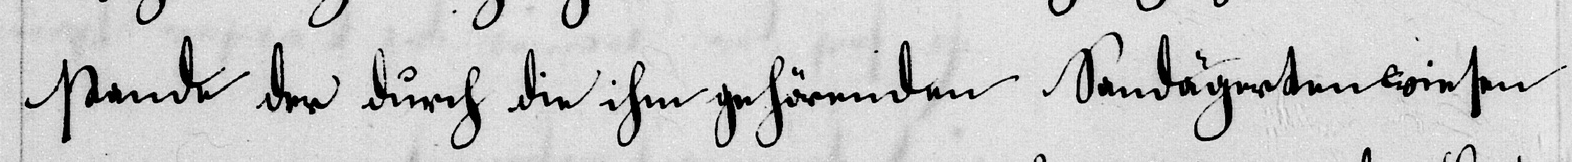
stand der durch die ihm gehörenden Sandägertenwiesen
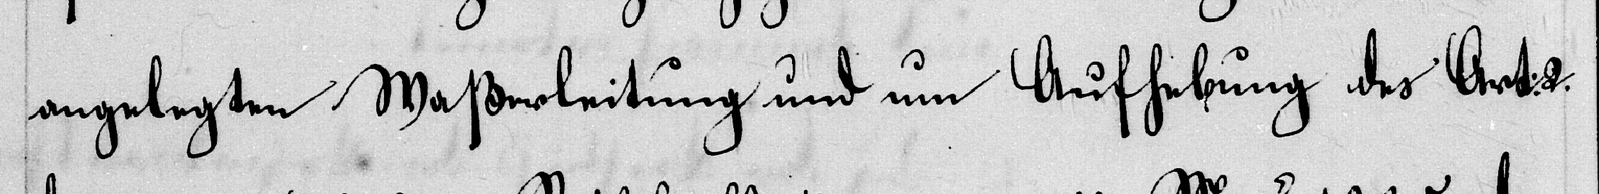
angelegten Waßerleitung und um Aufhebung des Art: 2.
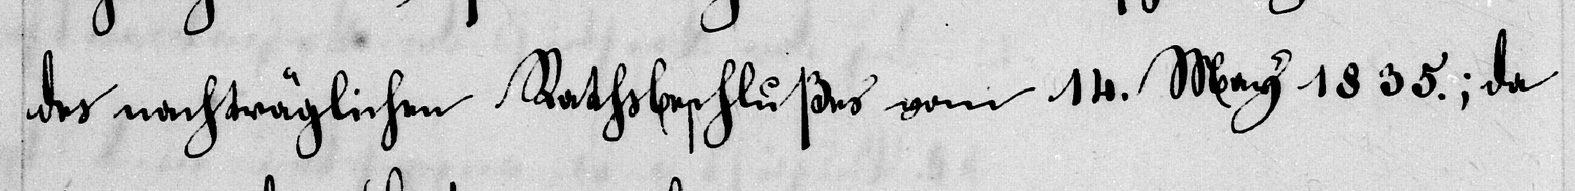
des nachträglichen Rathsbeschlußes vom 14. May 1835.; da
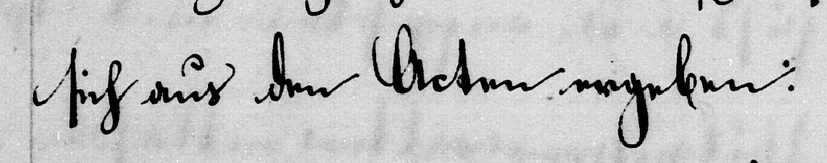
sich aus den Acten ergeben:
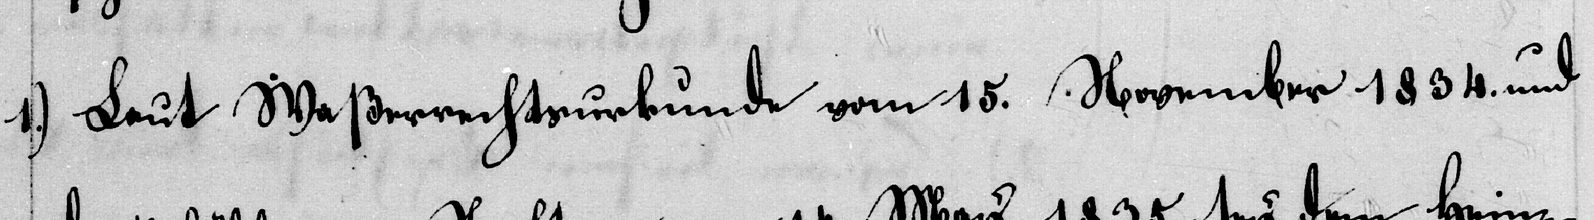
1.) Laut Waßerrechtsurkunde vom 15. November 1834. und
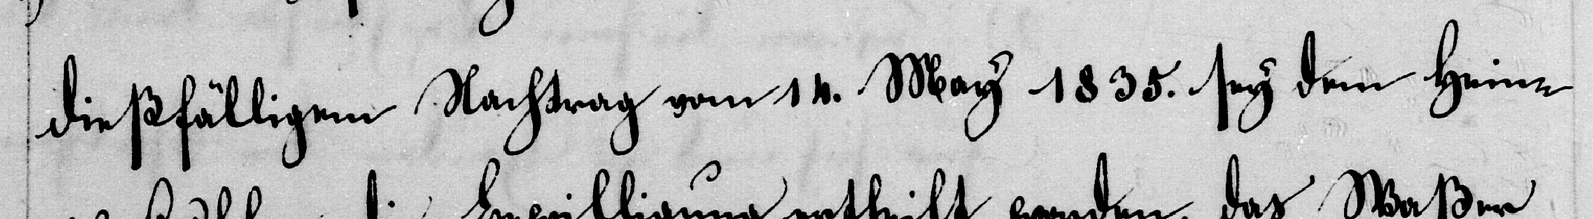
dießfälligem Nachtrag vom 14. May 1835. sey dem Hein¬
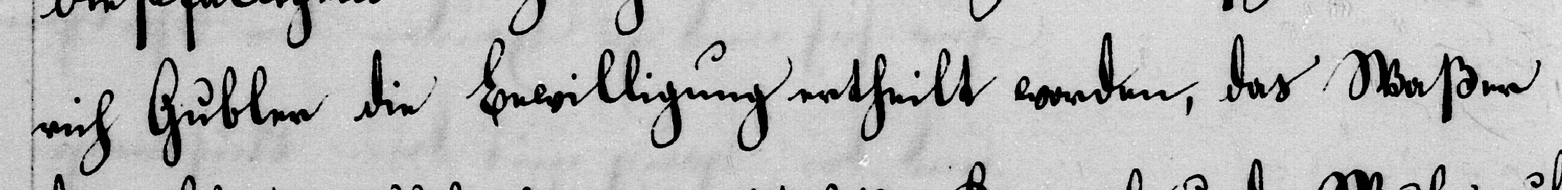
rich Gubler die Bewilligung ertheilt worden, das Waßer
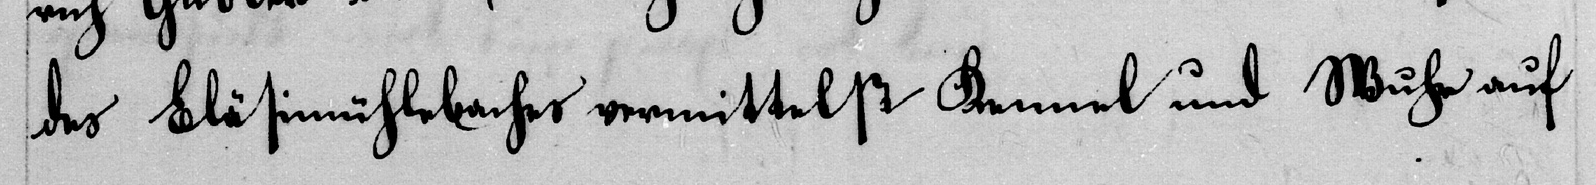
des Bläsimühlebaches vermittelst Kennel und Wuhr auf
